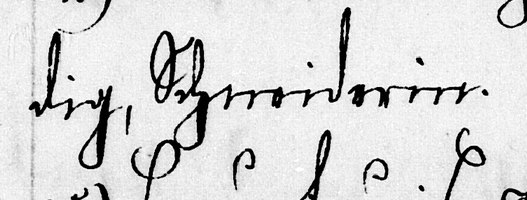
dig, Schneiderin.
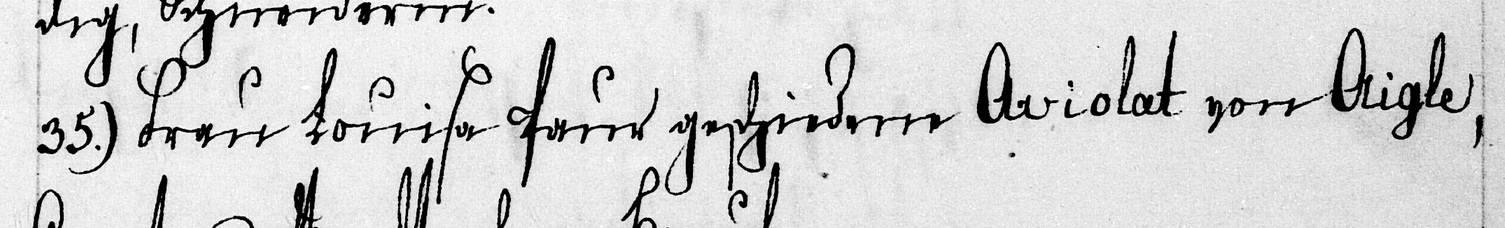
35.) Frau Louisa Paur geschiedene Aviolat von Aigle,
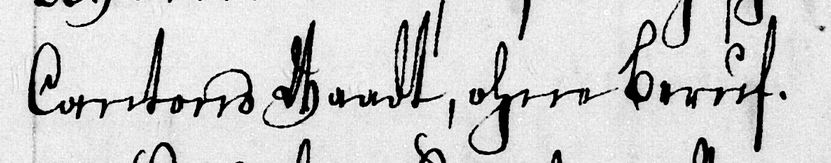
Cantons Waadt, ohne Beruf.
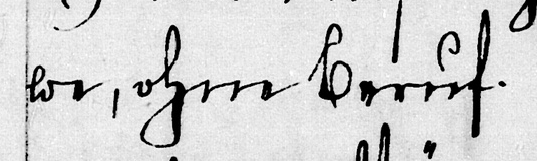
we, ohne Beruf.
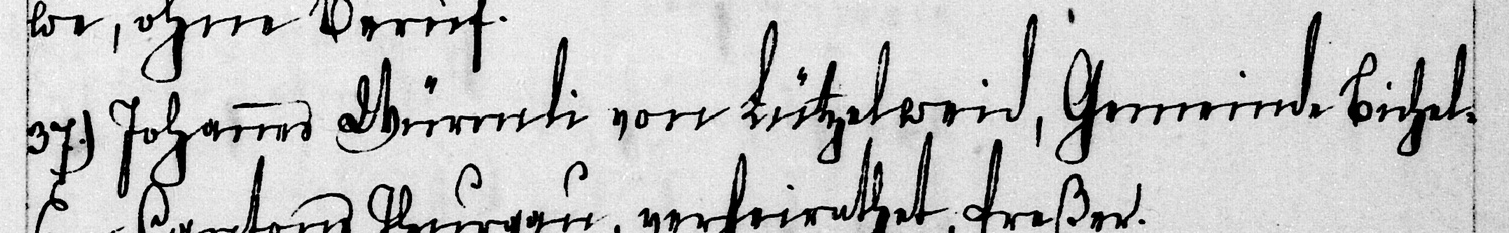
37.) Johannes Würmli von Lützelweid, Gemeinde Bichel¬
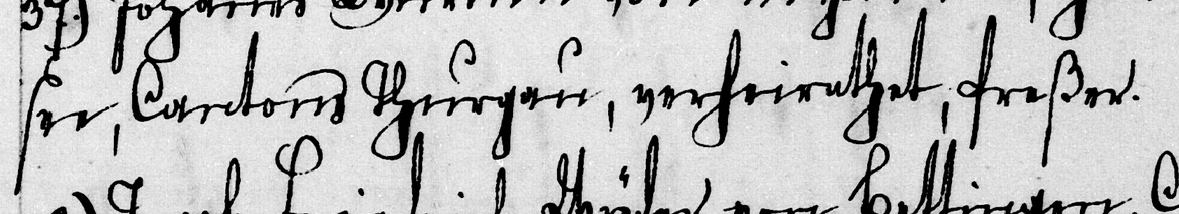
see, Cantons Thurgau, verheirathet, Preßer.
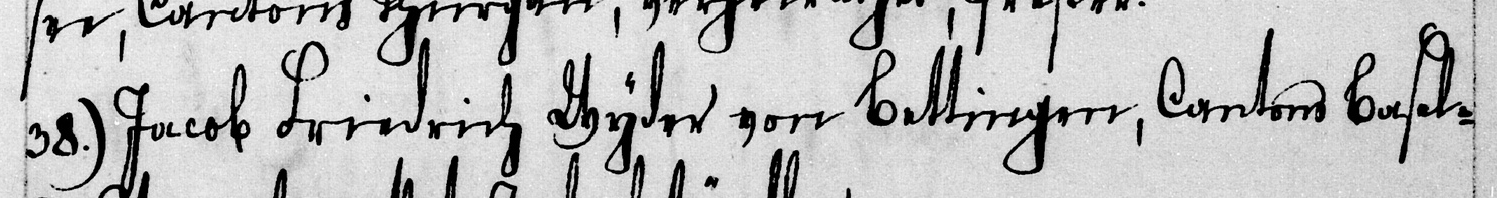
38.) Jacob Friedrich Wyder von Bettingen, Cantons Basel-S¬
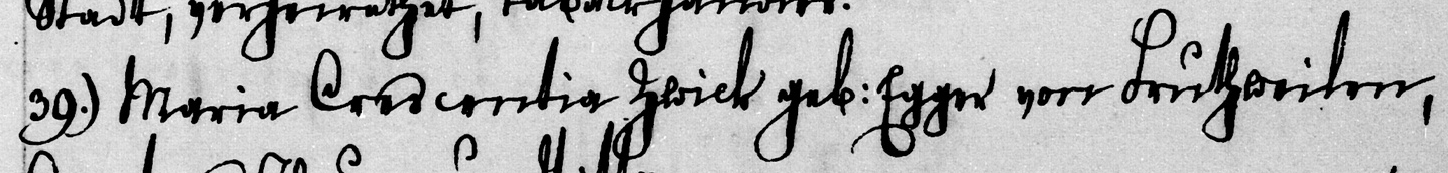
39.) Maria Crescentia Zwick geb: Egger von Fruthweilen,
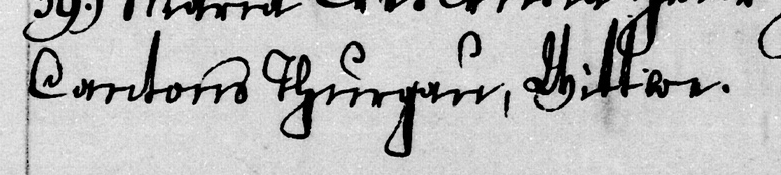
Cantons Thurgau, Wittwe.
